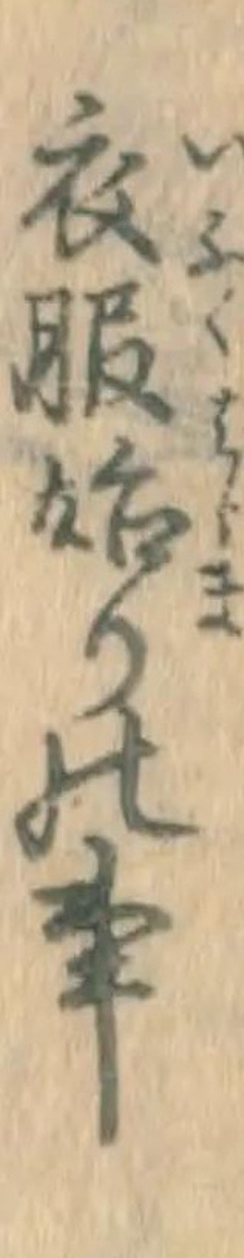衣服始りの事
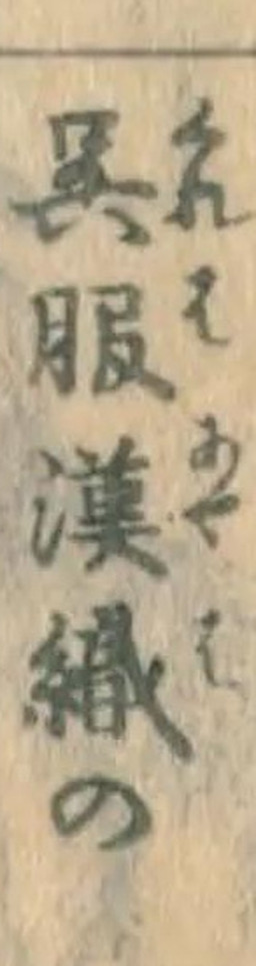呉服漢織の
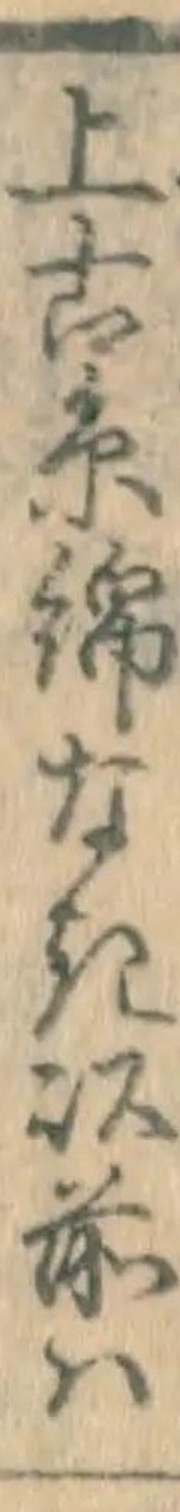上古糸綿なき以前は
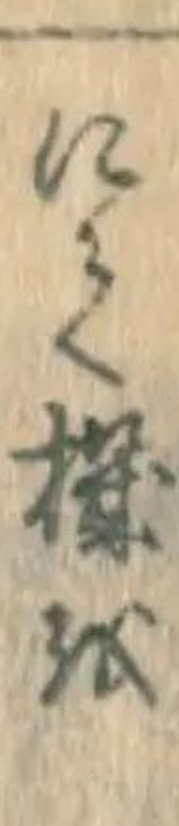にて機を
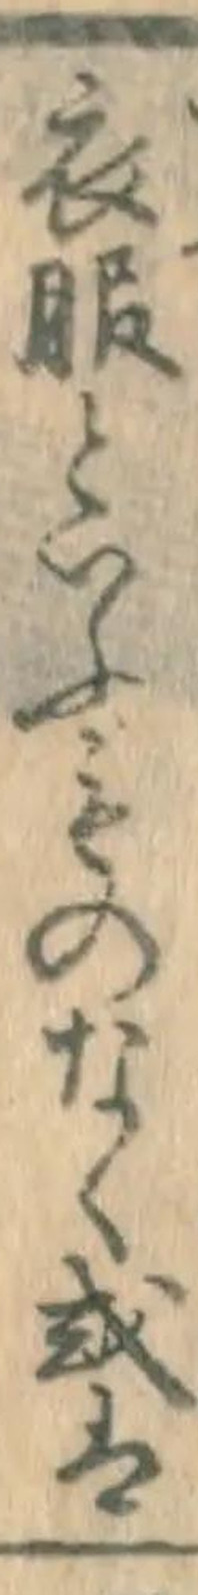衣服といふものなく或は
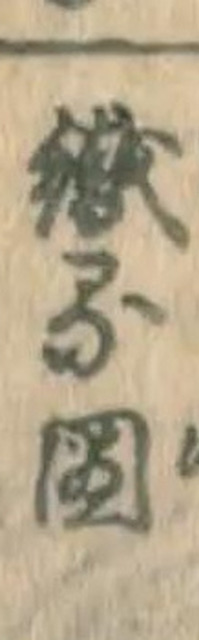織る図
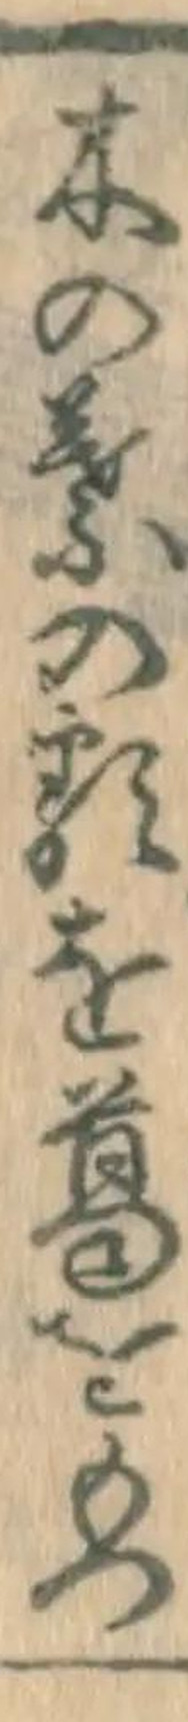木の葉の類を葛をも
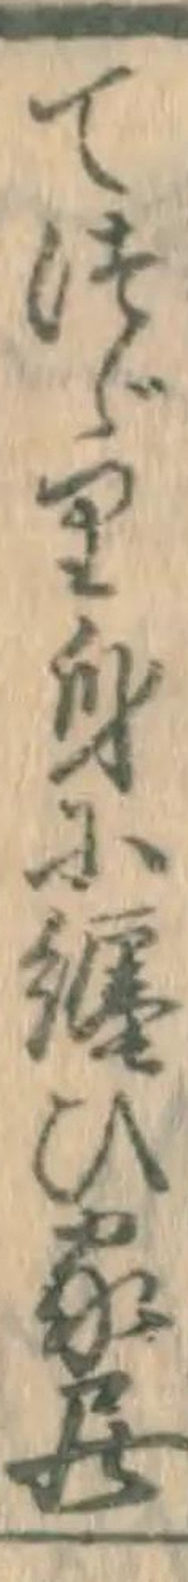つてつゞり身に纏ひ家居
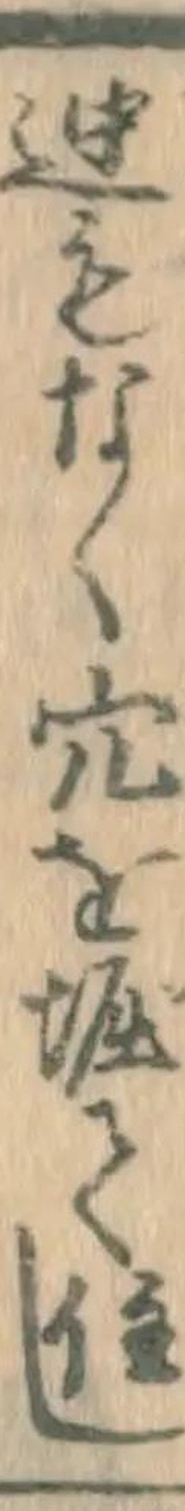迚もなく穴を堀て住し
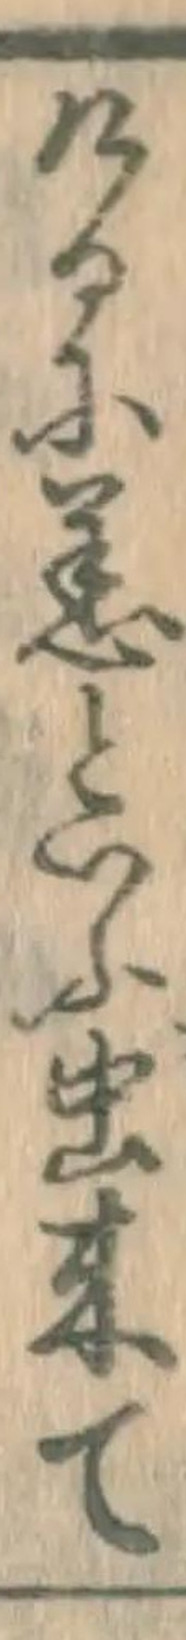けるに恙といふ虫来て
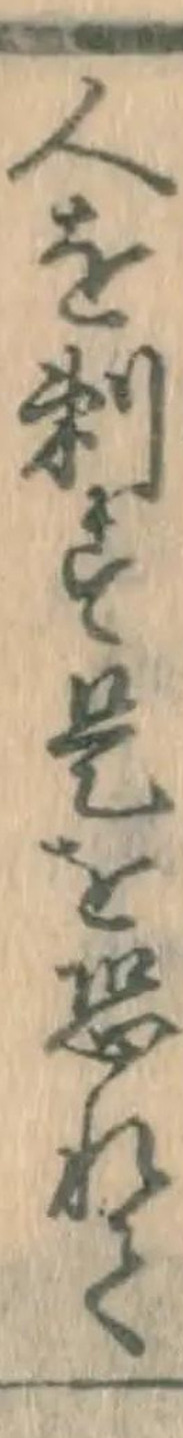人を刺す是を恐れて
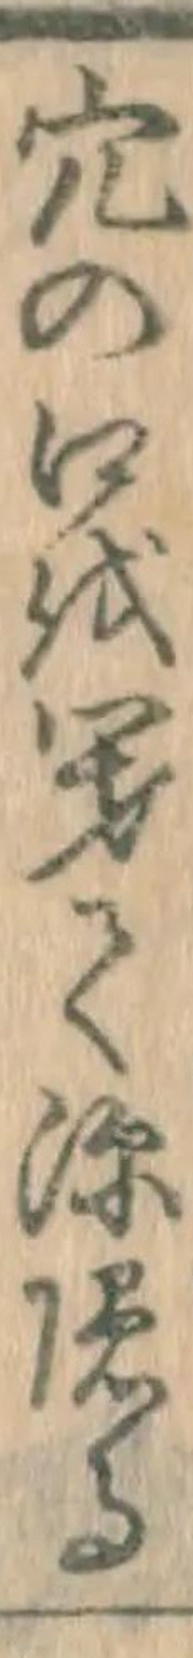穴の口を閉て深隠る
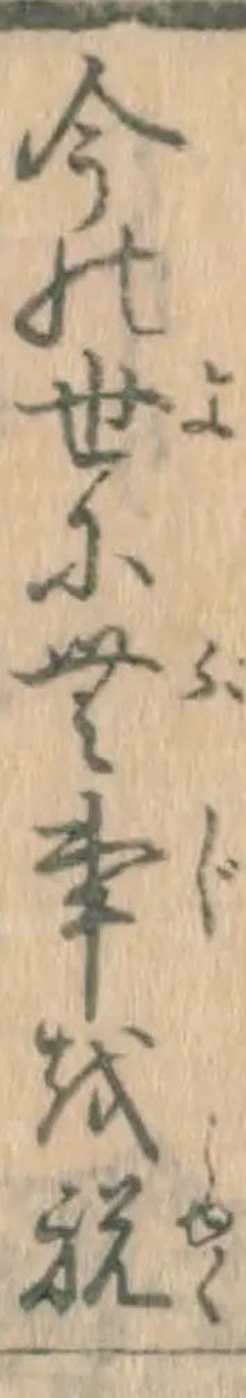今の世に無事を祝
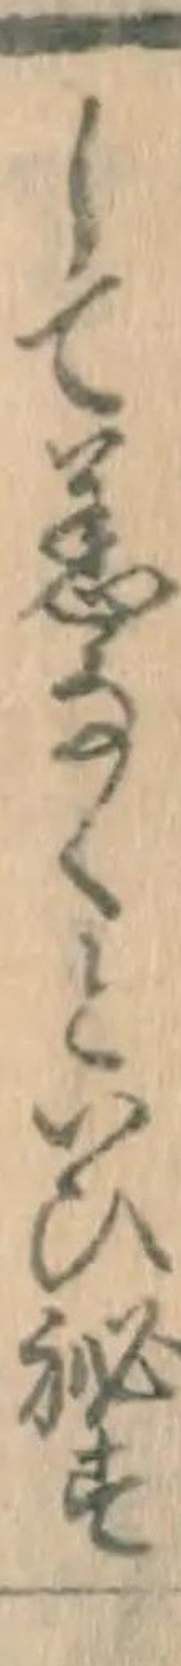して恙なくといひ秘す
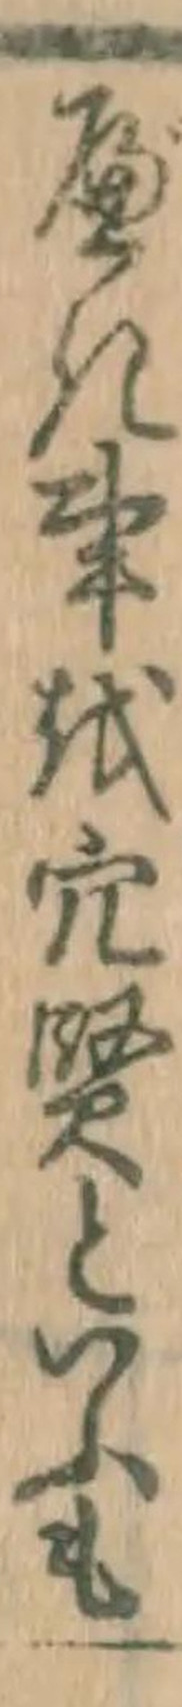べき事を穴賢といふも
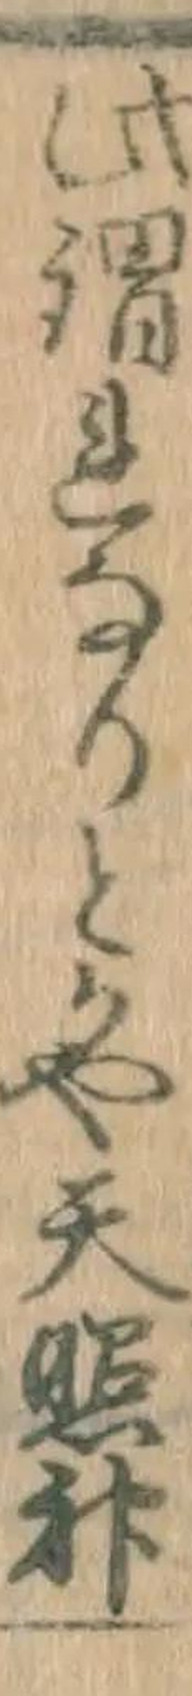此謂れなりとかや天照神
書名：養蚕秘録 3巻. [3]
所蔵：国立国会図書館 National Diet Library, JAPAN
